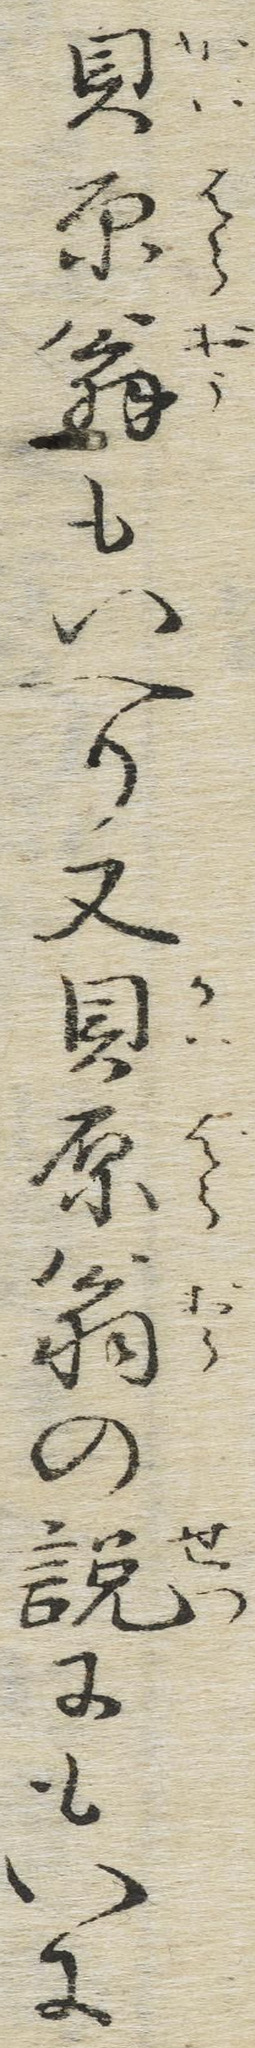貝原翁もいへり又貝原翁の説にもいに
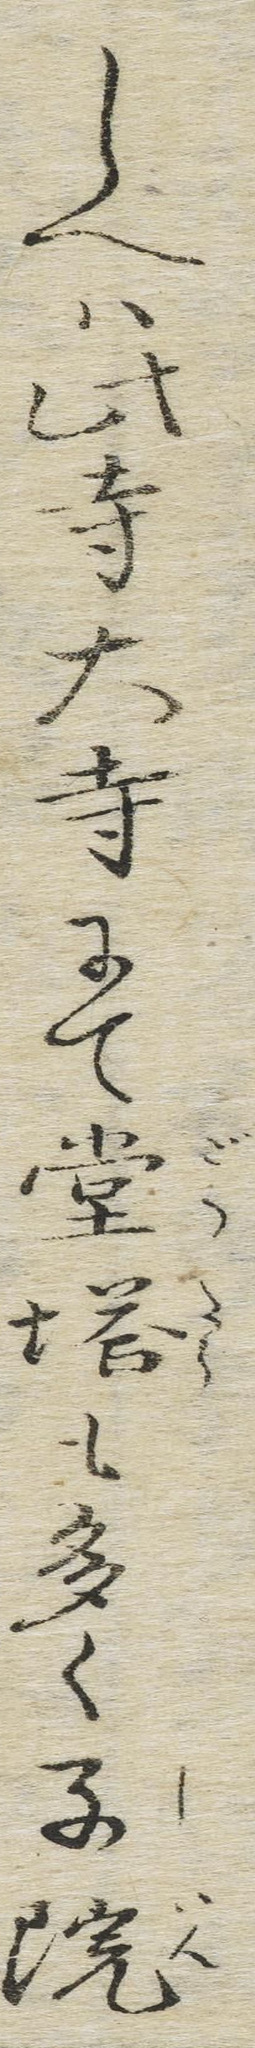しへは此寺大寺にて堂塔も多く子院
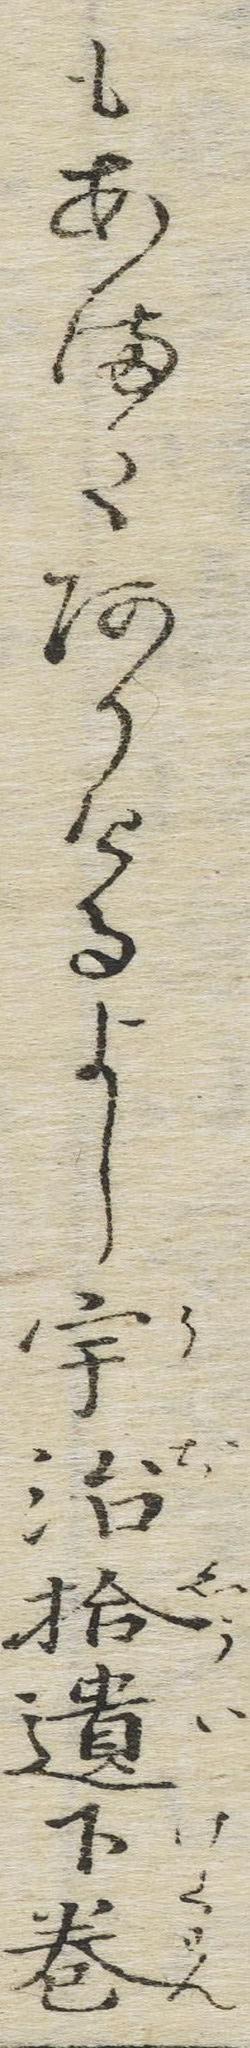もあまたありけるよし宇治拾遺下巻
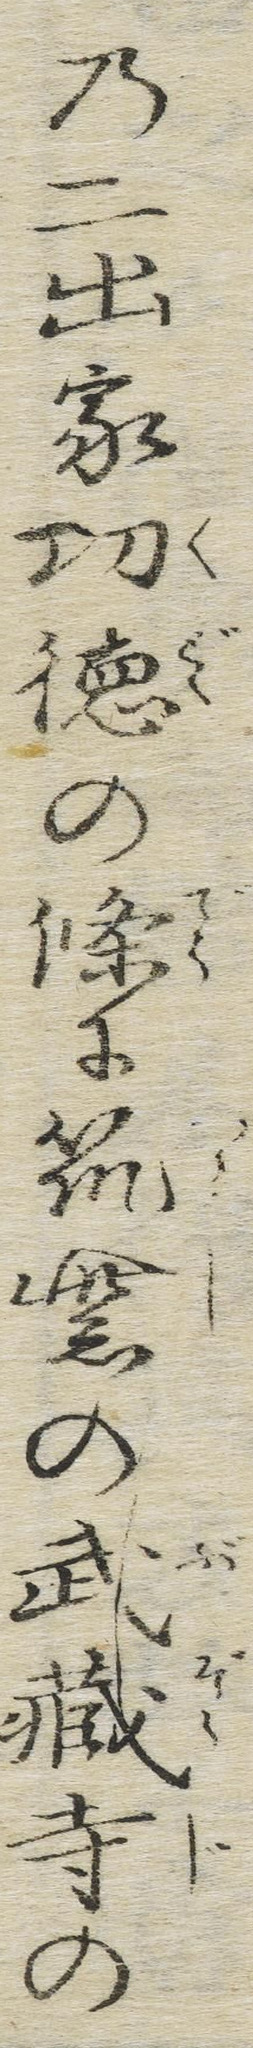乃二出家功徳の条に筑紫の武蔵寺の
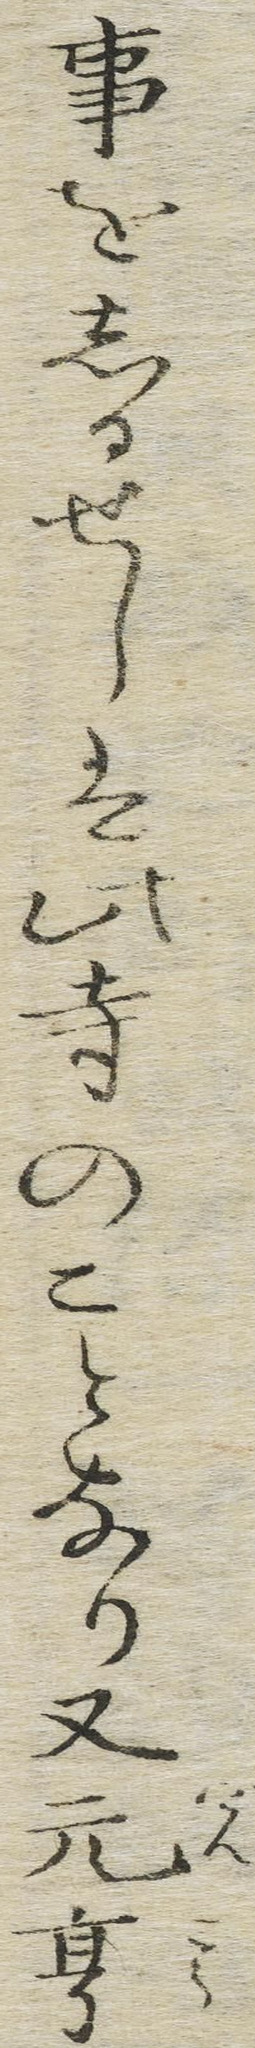事をしるせしは此寺のことなり又元亨
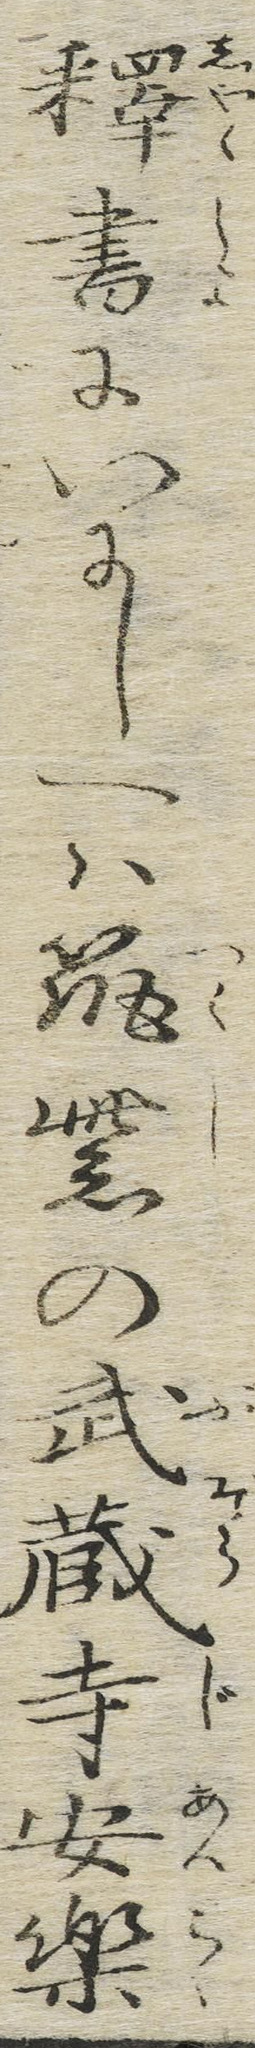釈書にいにしへは筑紫の武蔵寺安楽
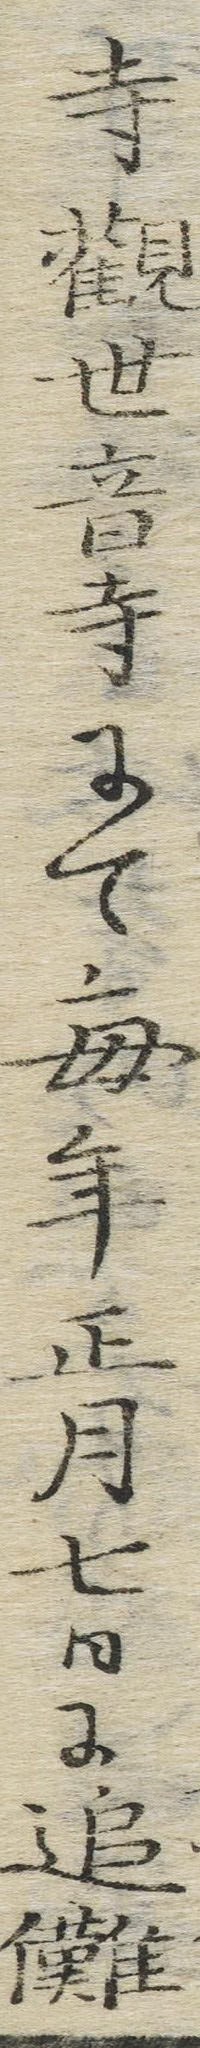寺観世音寺にて毎年正月七日に追儺

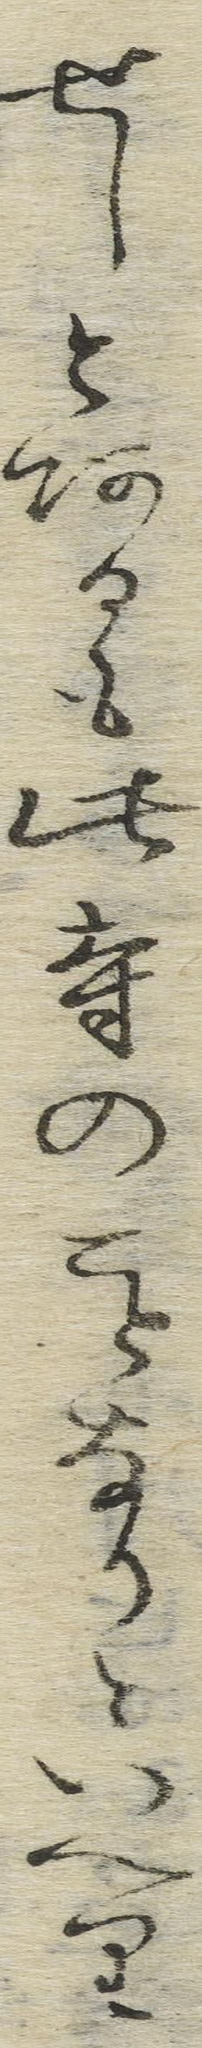せしとあるも此寺のことなりといへり
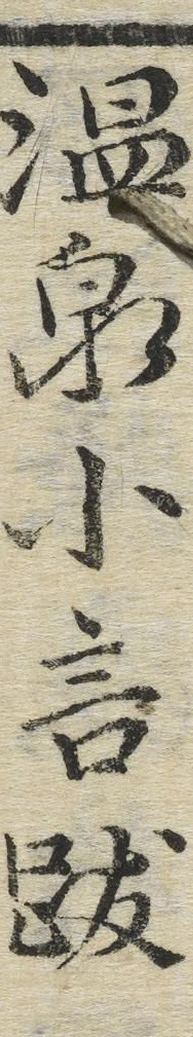温泉小言跋
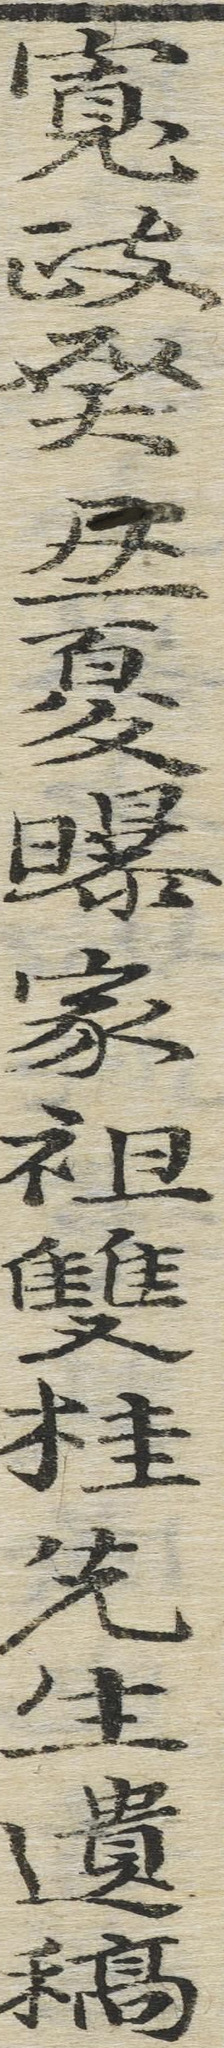寛政癸丑夏曝家祖双桂先生遺稿
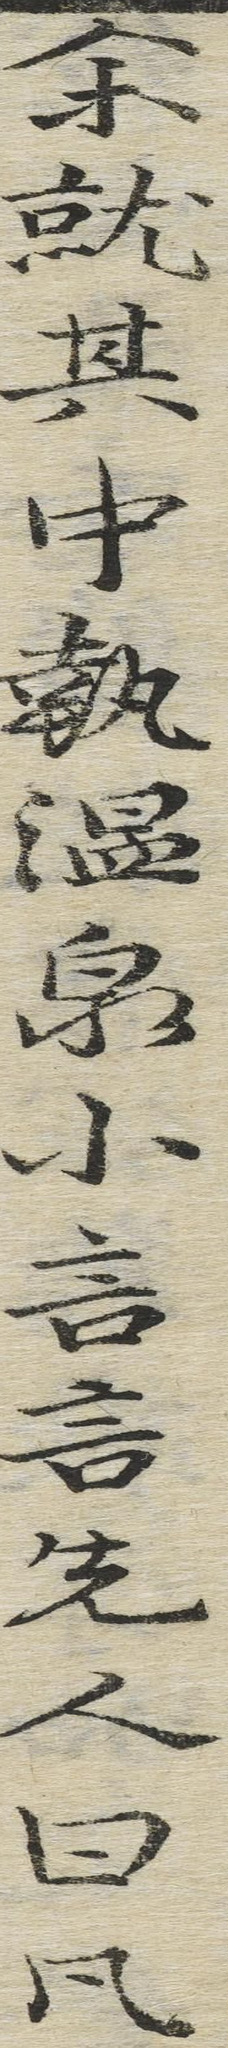余就其中執温泉小言言先人曰凡
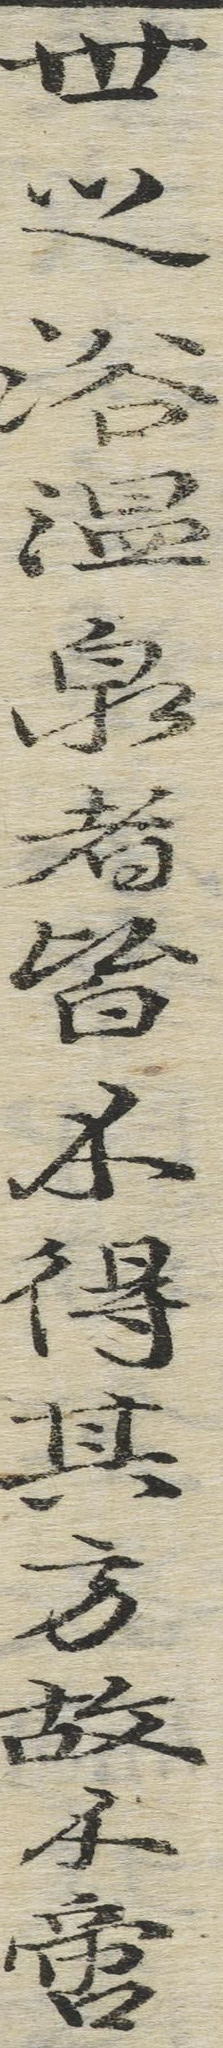世之浴温泉者皆不得其方故不啻
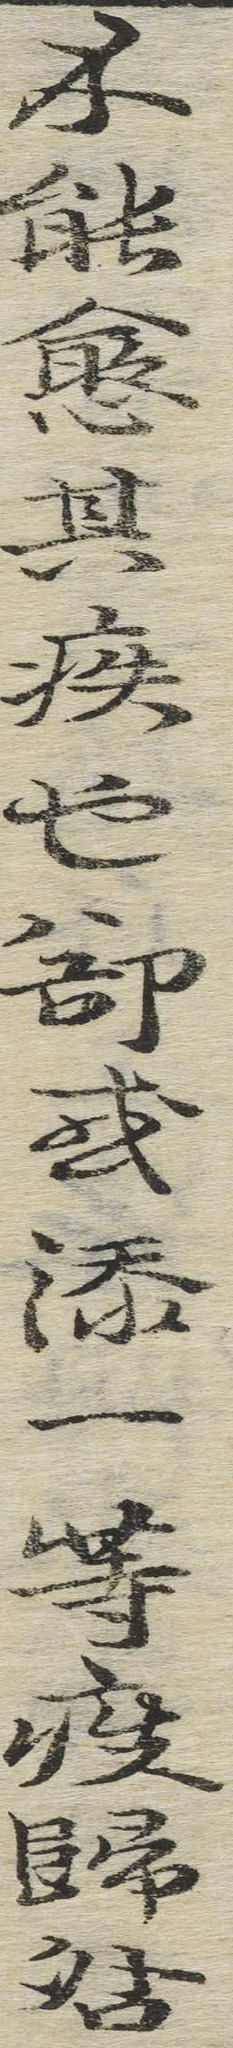不能愈其疾也却或添一等疾帰咎
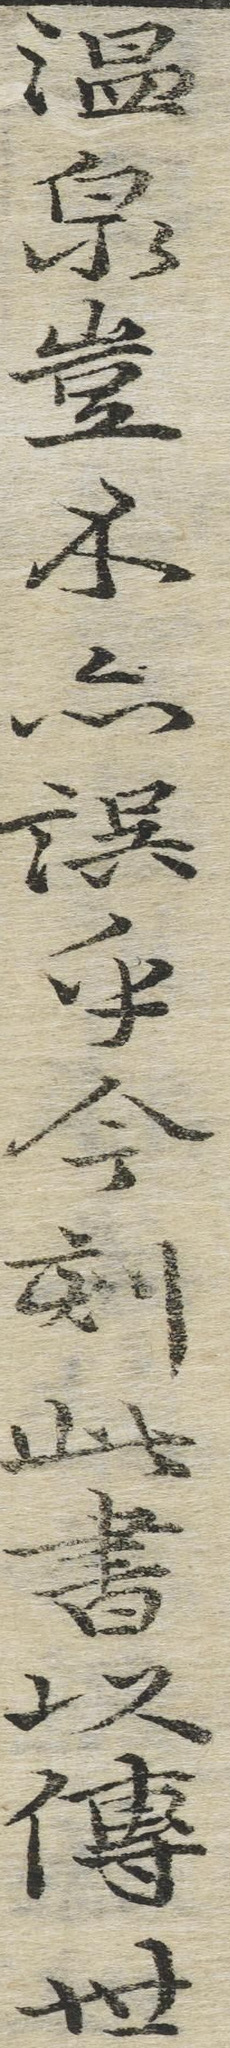温泉豈不亦誤乎今刻此書以伝世
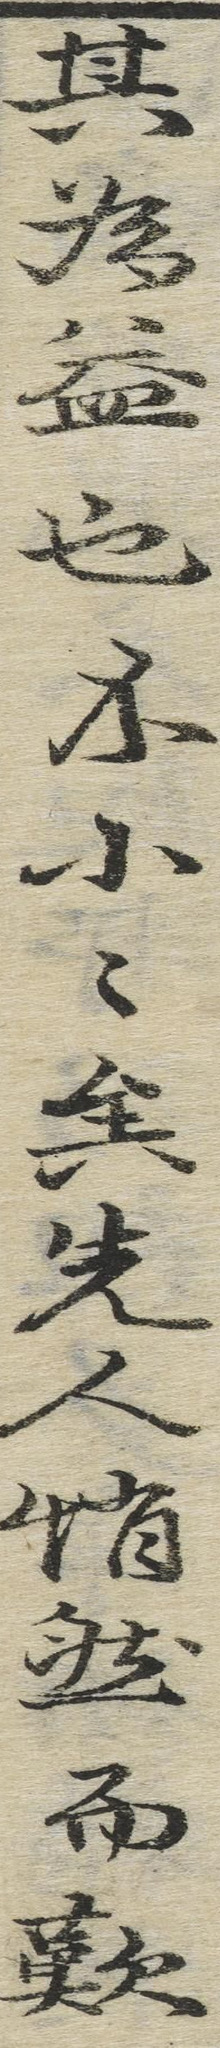其為益也不小ゝ矣先人悄然而歎

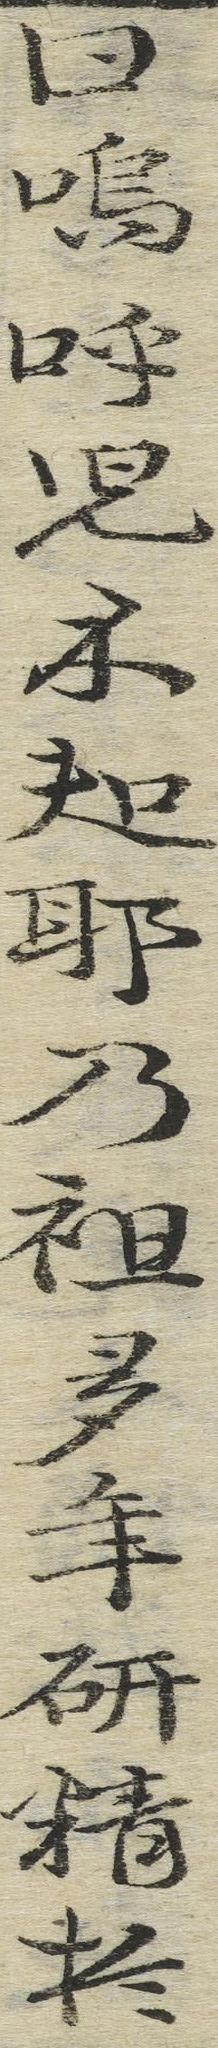曰嗚呼児不知耶乃祖多年研精於
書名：温泉考
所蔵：東京大学地震研究所図書室 Earthquake Research Institute Library, The University of Tokyo, JAPAN
